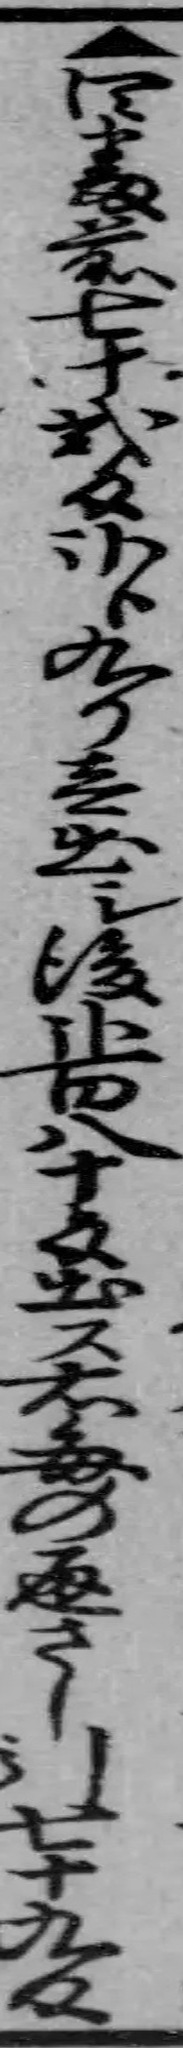▲四番前七十弐匁弐分九り壱出し後弐百八十匁出す右毎の通さし引七十九匁
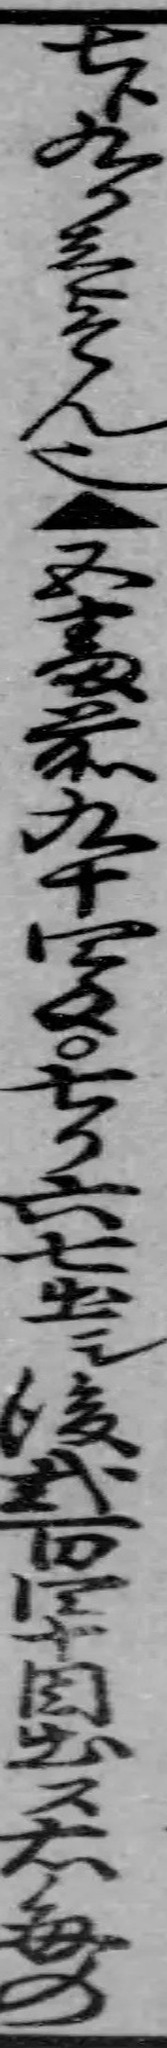七分九り壱そん也▲五番前九十四匁〇七り六七出し後弐百四十目出す右毎の
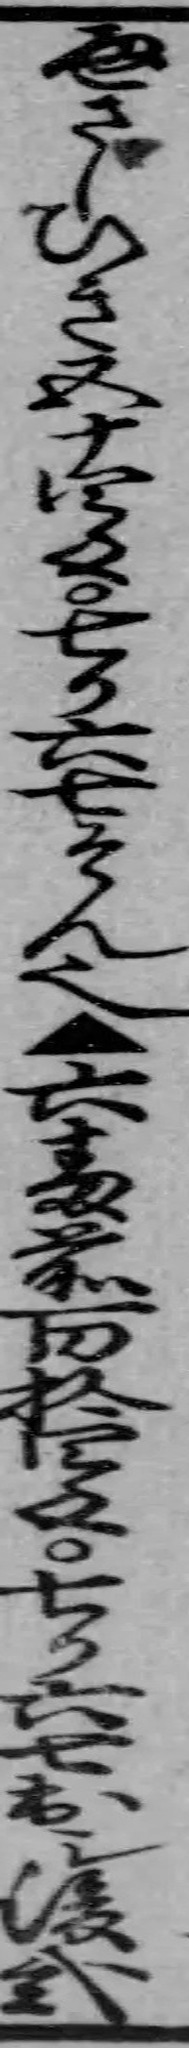通さしひき五十四匁〇七り六七そん也▲六番前百拾四匁〇七り六七出し後弐
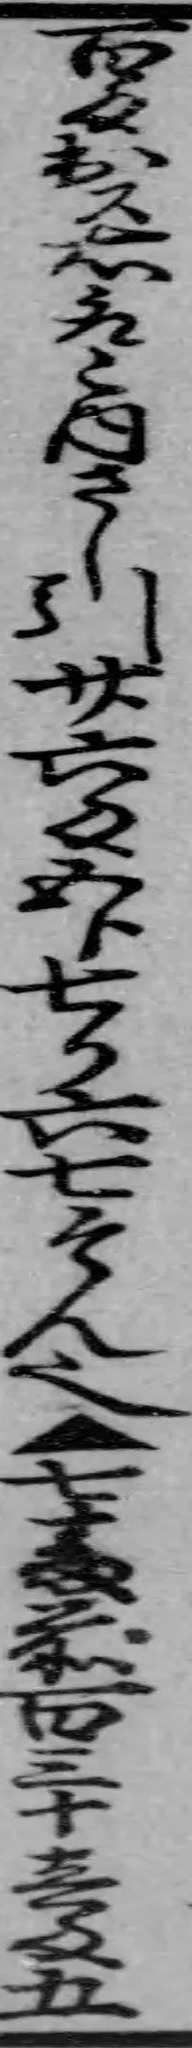百匁出す右取候内さし引廿六匁五分七り六七そん也▲七番前百三十壱匁五
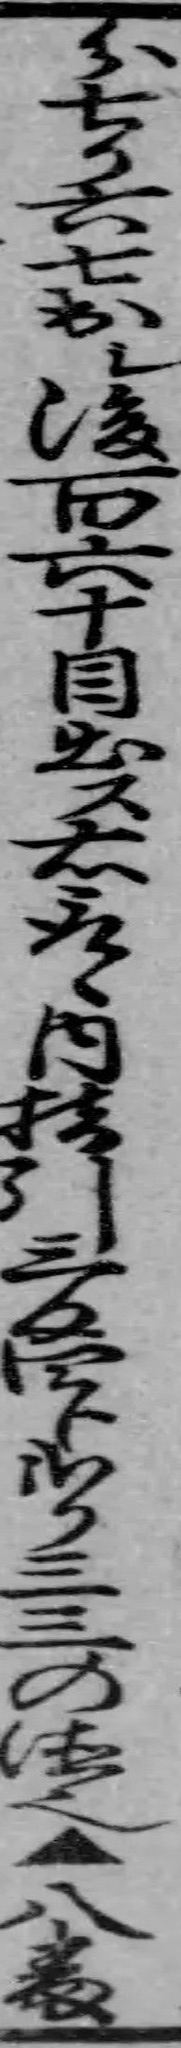分七り六七出し後百六十目出す右取候内指引三匁四分弐り三三の徳也▲八番
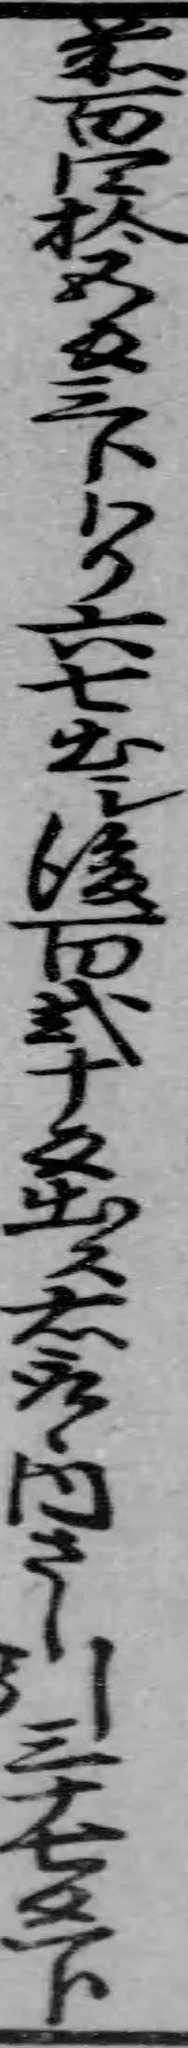前百四拾五匁三分弐り六七出し後百弐十匁出す右取候内さし引三十七匁一分
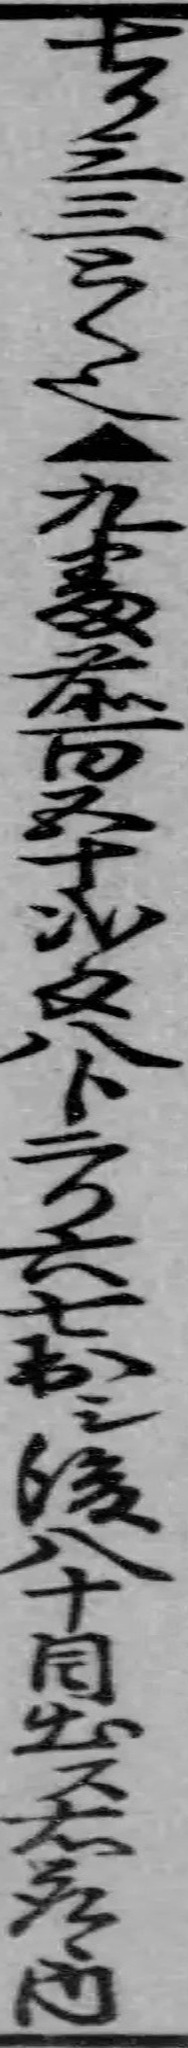七り三三とく也▲九番前百五十弐匁八分二り六七出し後八十目出す右取候内
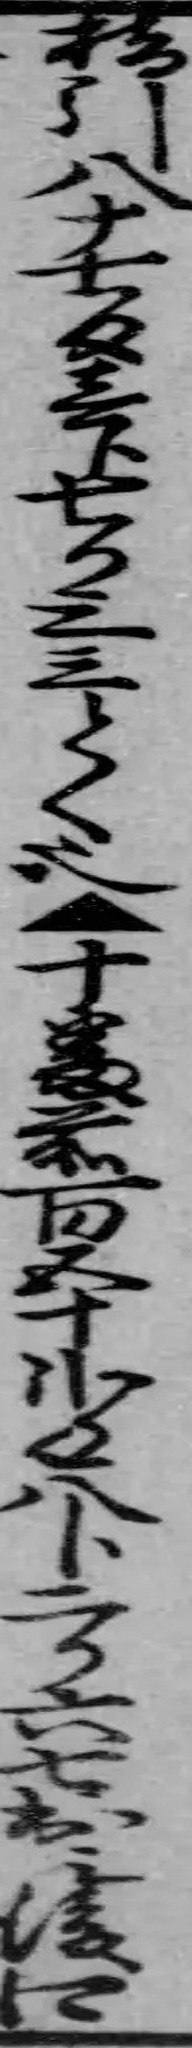指引八十七匁壱分七り三三とく也▲十番前百五十弐匁八分二り六七出し後四
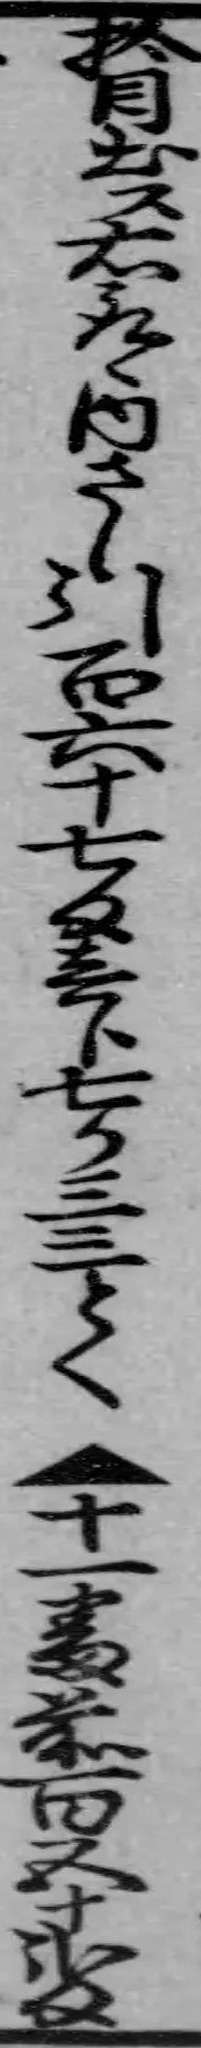拾目出す右取候内さし引百六十七匁壱分七り三三とく▲十一番前百五十弐匁
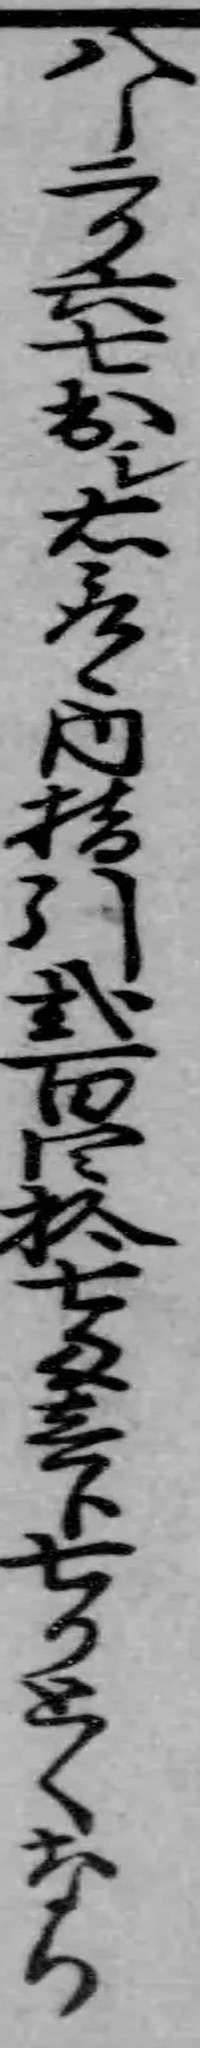八分二り六七出し右取候内指引弐百四拾七匁壱分七りとくなり
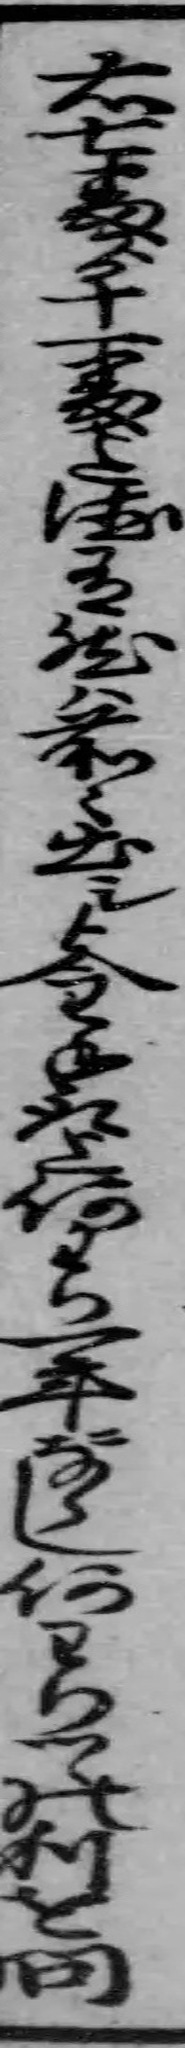右七番より十一番迄徳有然は前々出しと金手取迄何わり一年にならし何わりつゝの利を問
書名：長崎むじん物語 大正15 米山堂
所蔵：国立国会図書館 National Diet Library, JAPAN
